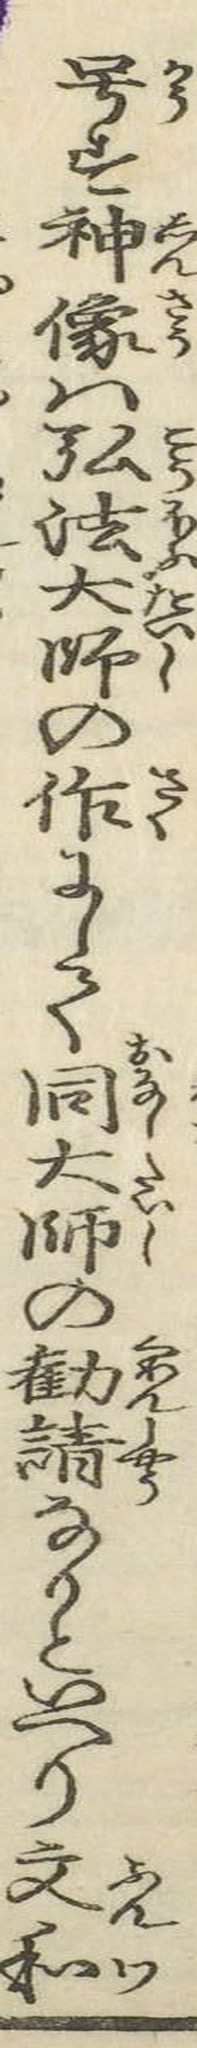号す神像は弘法大師の作にして同大師の勧請なりといへり文和
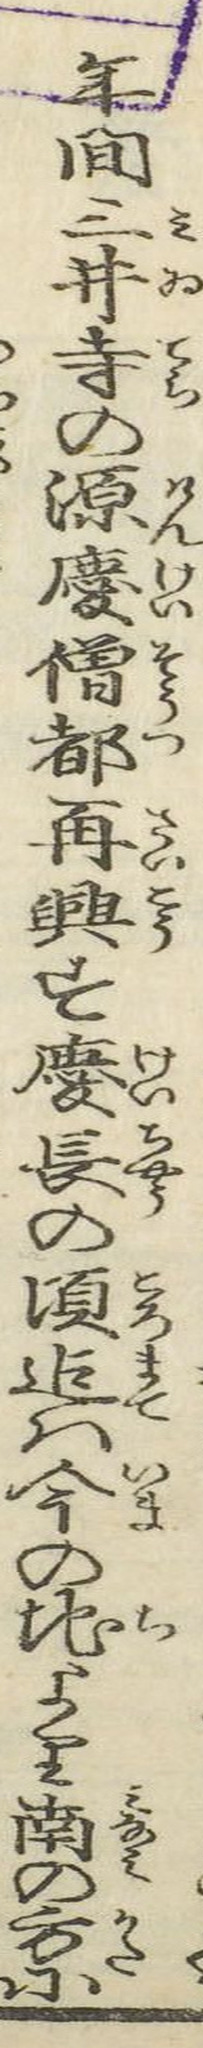年間三井寺の源慶僧都再興す慶長の頃迄は今の地より南の方に
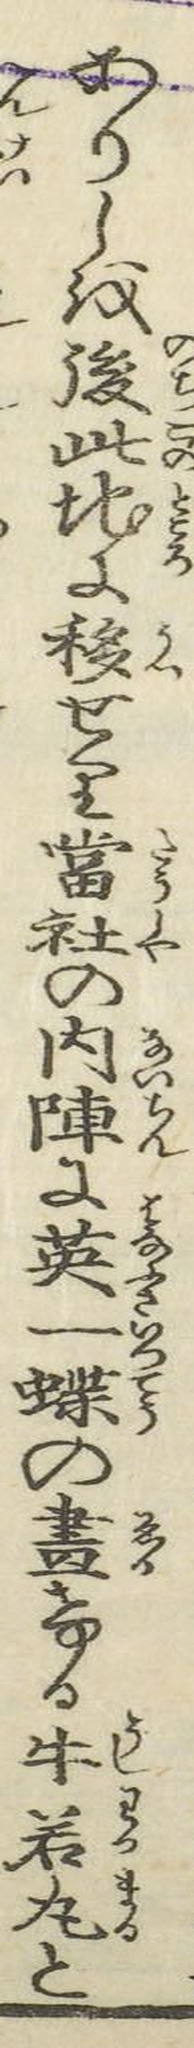ありしを後此地に移せり当社の内陣に英一蝶の書ける牛若丸と
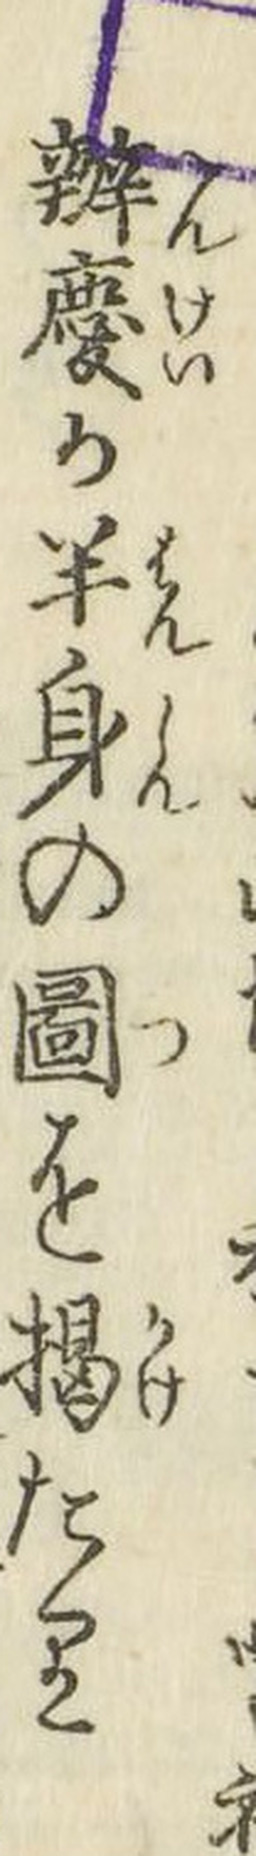弁慶か半身の図を掲たり
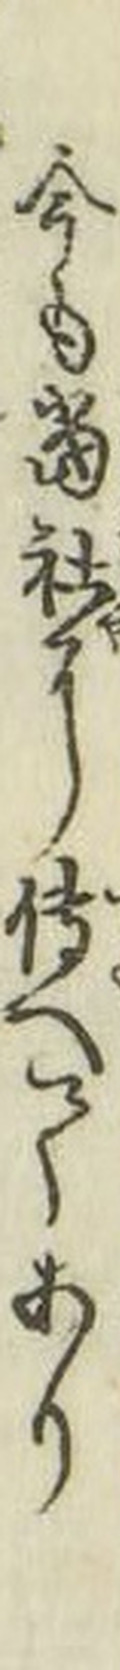今も当社に伝へてあり
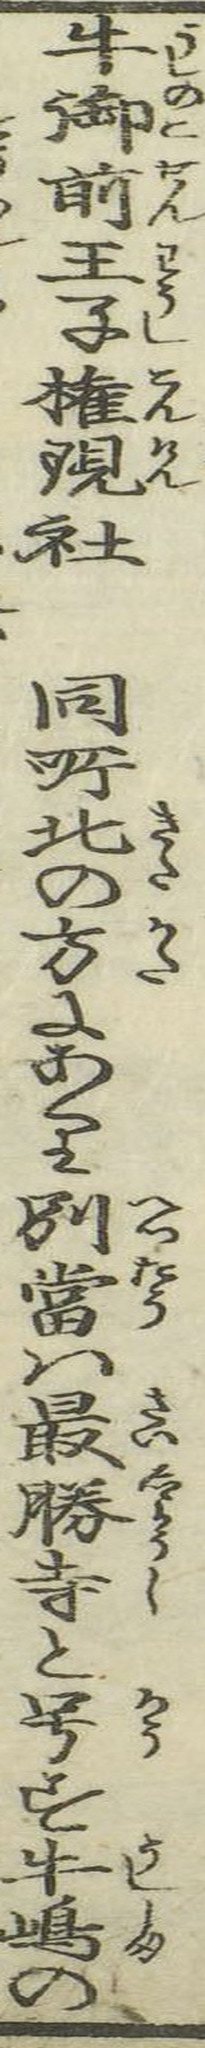牛御前王子権現社同所北の方にあり別当は最勝寺と号す牛島の
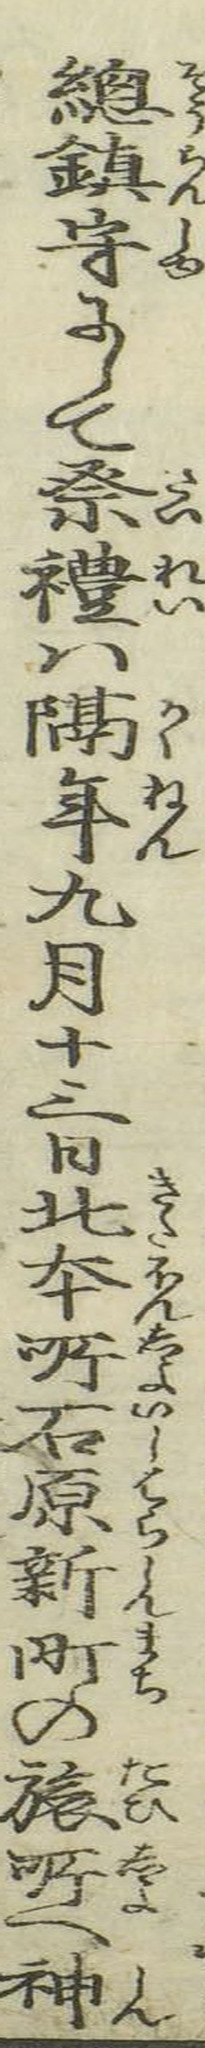総鎮守にして祭礼は隔年九月十三日北本所石原新町の旅所へ神

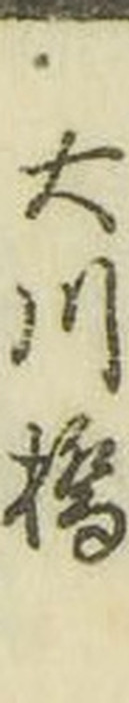大川橋
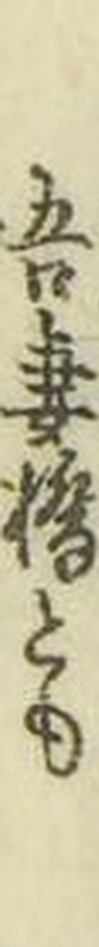吾妻橋とも
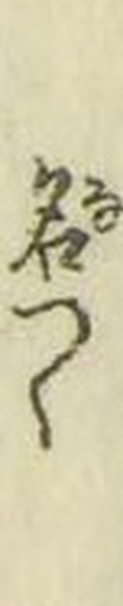名つく
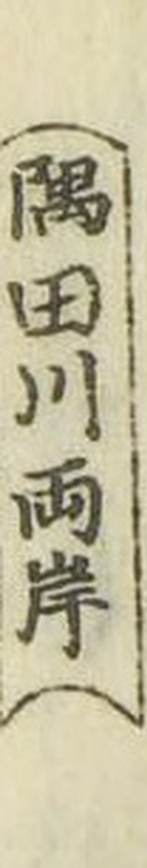隅田川両岸
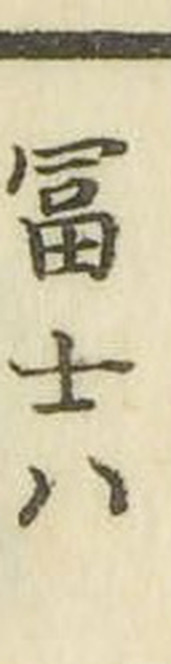富士は
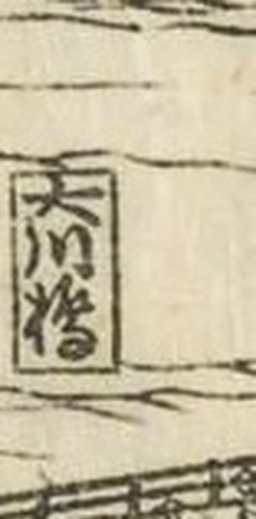大川橋
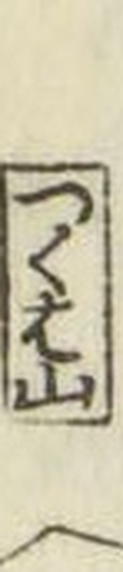つくは山
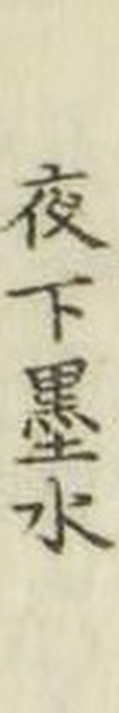夜下墨水
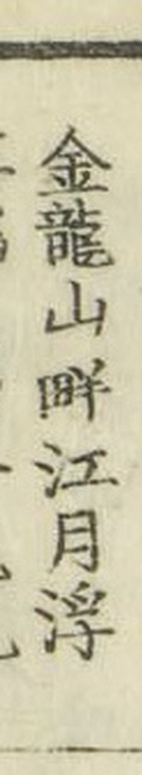金竜山畔江月浮
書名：江戸名所図会 20巻 巻之19
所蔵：東京学芸大学教育コンテンツアーカイブ
